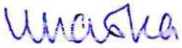ипатка
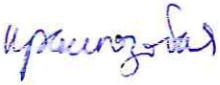краипозобая
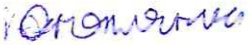коноплянка
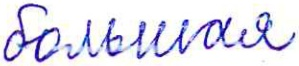большая
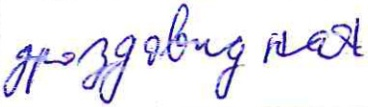дроздовидная
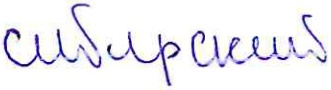сибирский
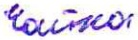чайка
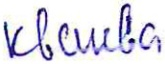кваква
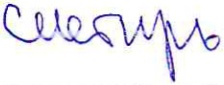снегирь
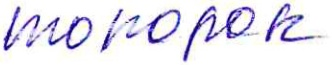топорок
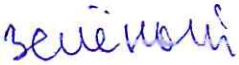зелёный
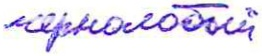чернолобый
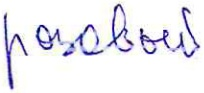розовый
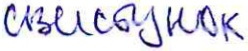свистунок
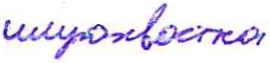широхвостка
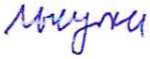лысуха
